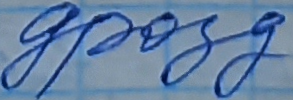дрозд
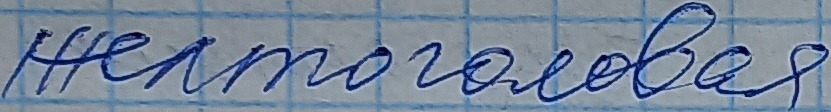желтоголовая
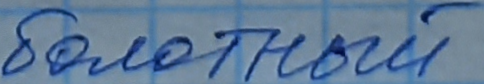болотный
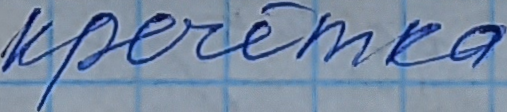кречётка
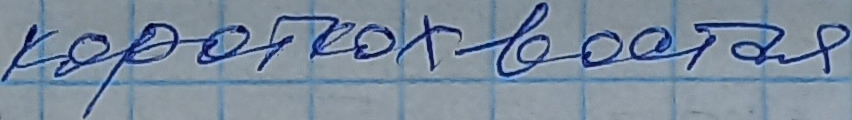короткохвостая
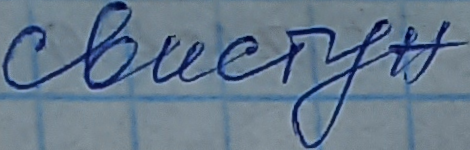свистун
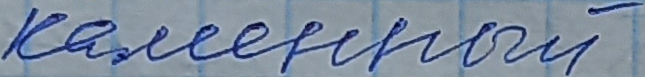каменный
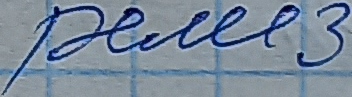ремез
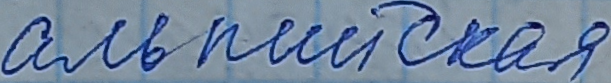альпийская
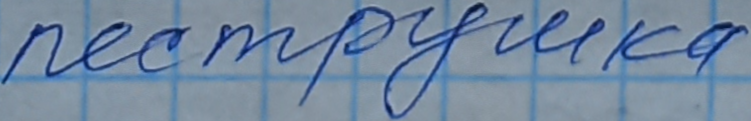пеструшка
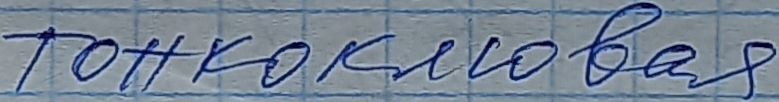тонкоклювая
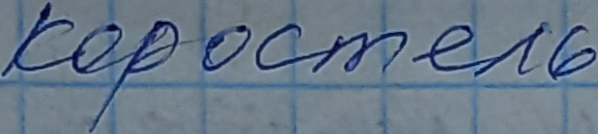коростель
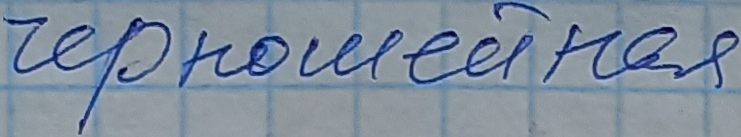черношейная
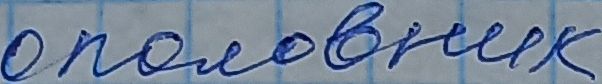ополовник
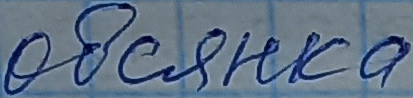овсянка
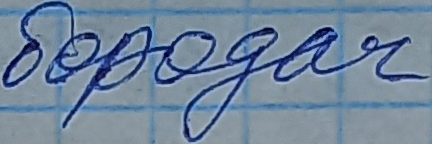бородач
